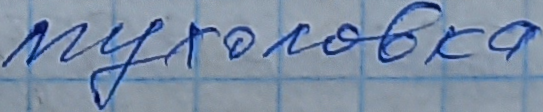мухоловка
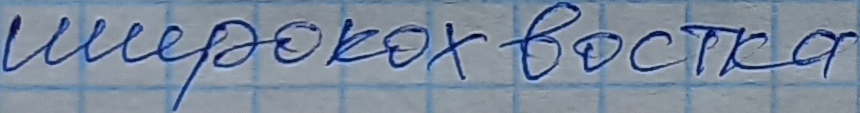широкохвостка
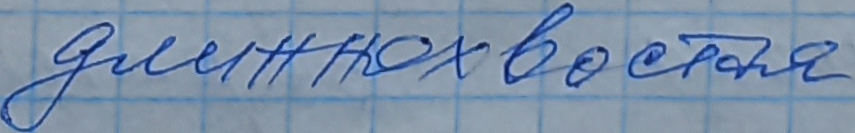длиннохвостая
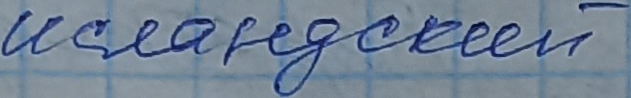исландский
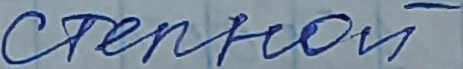степной
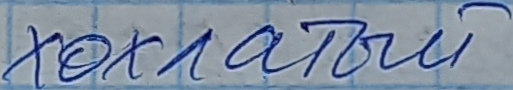хохлатый
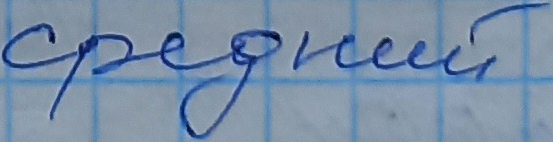средний
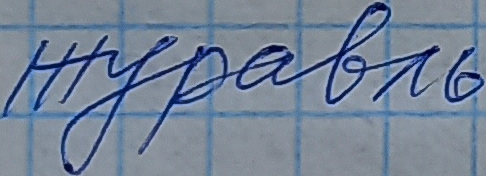журавль
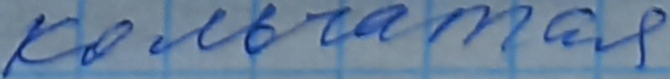кольчатая
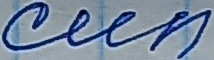сип
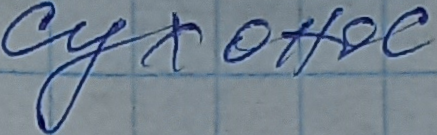сухонос
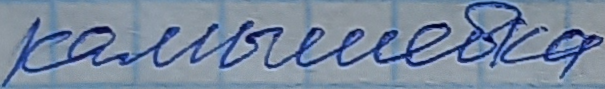камышевка
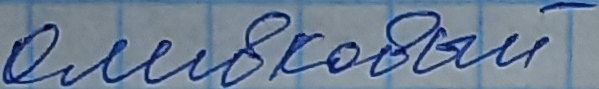оливковый
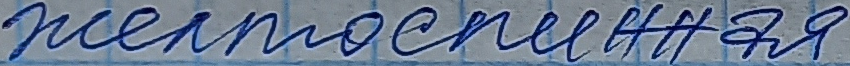желтоспинная
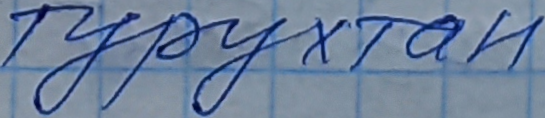турухтан
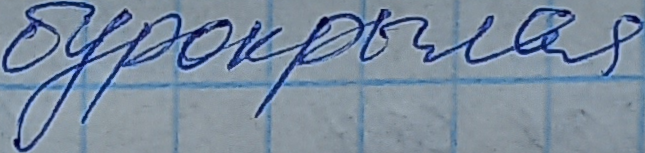бурокрылая
